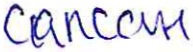сапсан
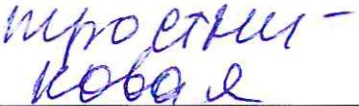тростни-ковая
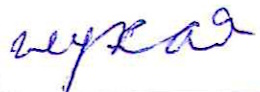глухая
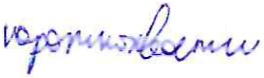короткохвости
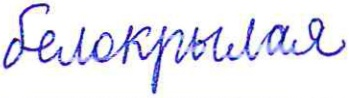белокрылая
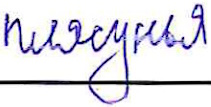плясунья
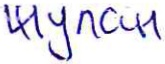жулан
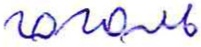гоголь
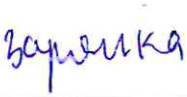зарянка
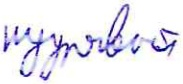кудрявый
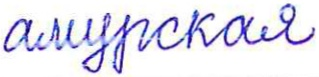амурская
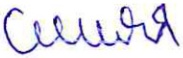синяя
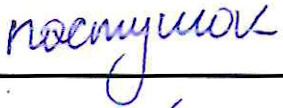пастушок
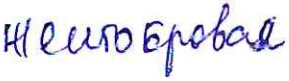желтобровая
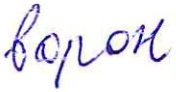ворон
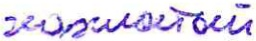хохлатый
